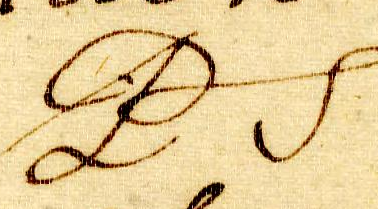PS
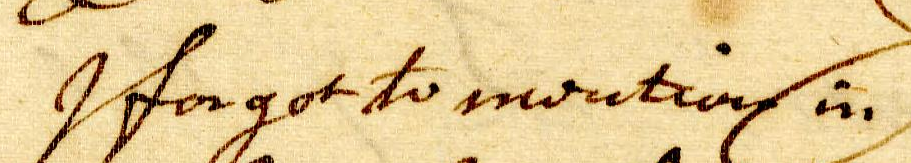I forgot to mention in
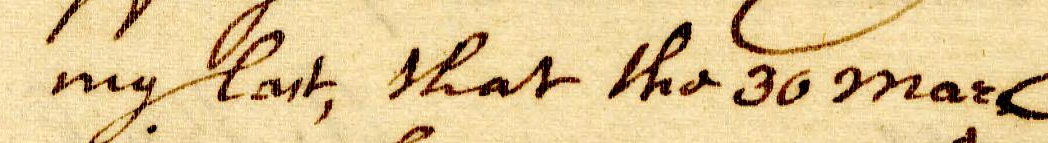my last, that the 30 Mar
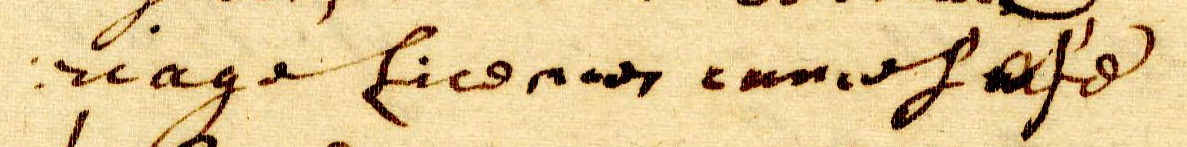-riage Licenses came Late
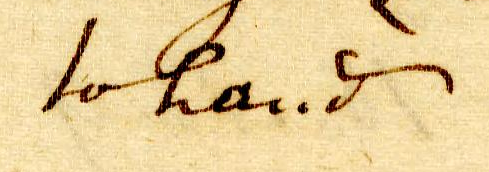to hand
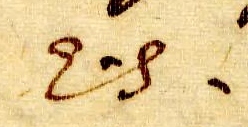E.S.
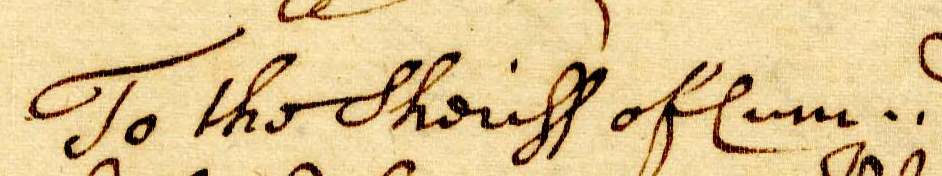To the Sheriff of Cum-
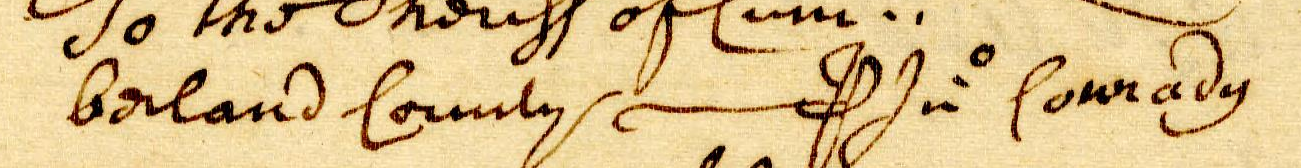berland County- per Jn^o Courady
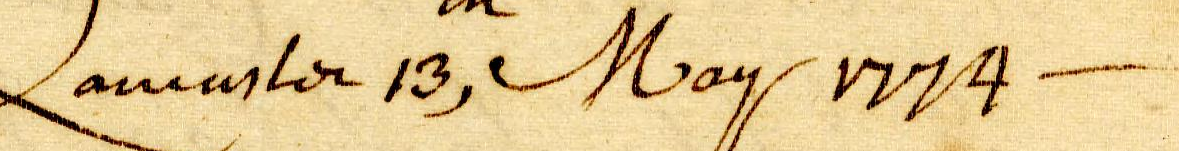Lancaster 13^th, May 1774-
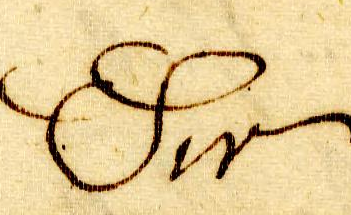Sir
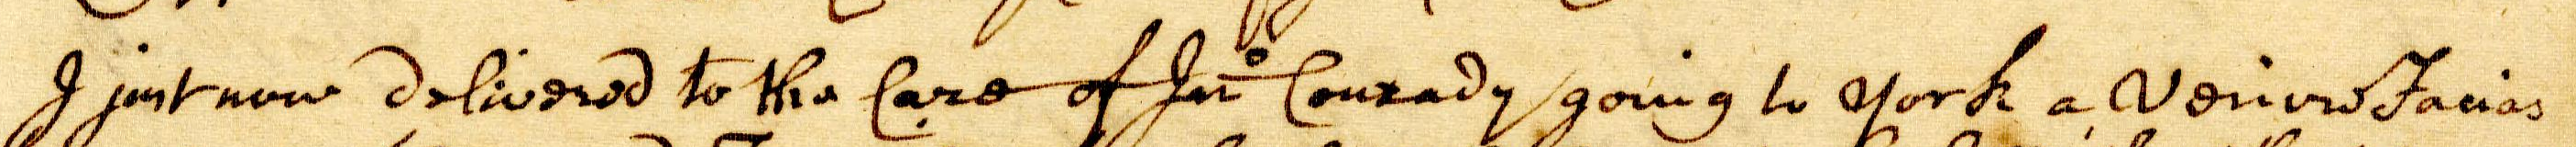I just now delivered to the Care of Jn^o Courady going to York a Venire Facias
